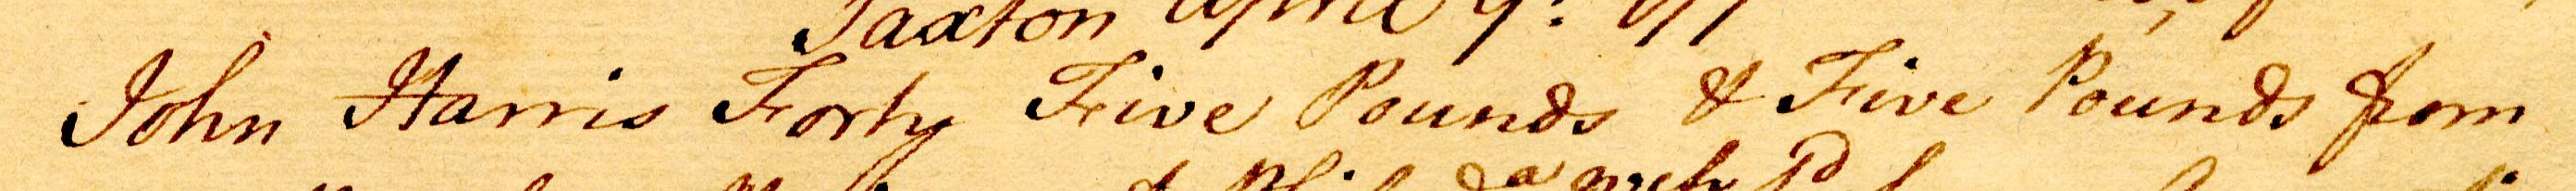John Harris Forty Five Pounds & Five Pounds from
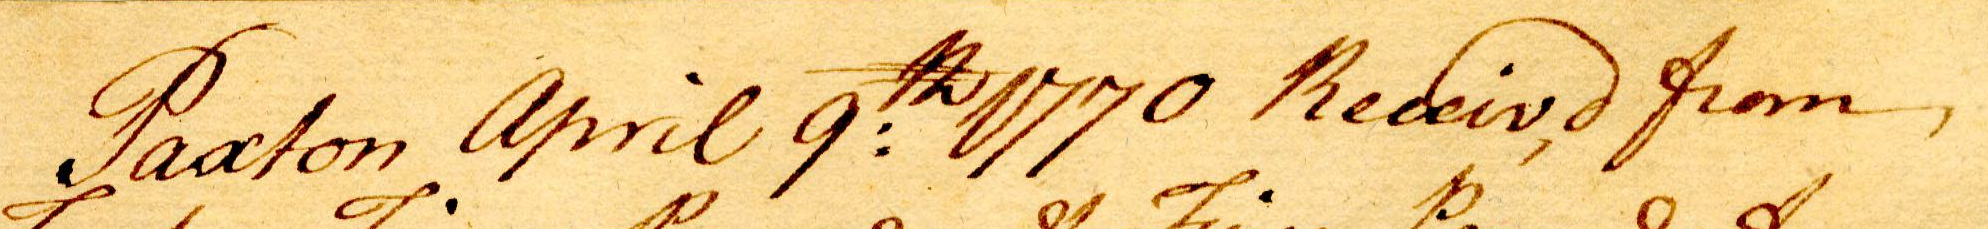Paxton April 9^th: 1770 Receiv'd from
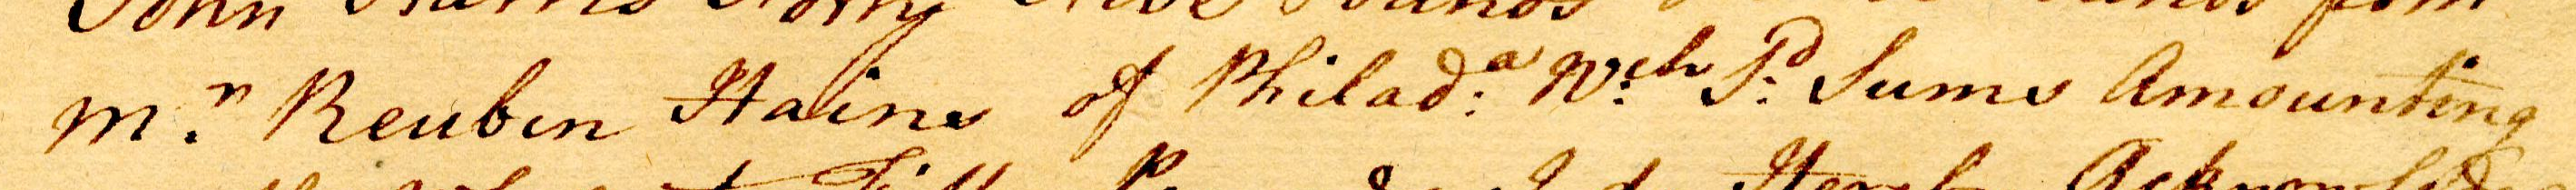M^r. Reuben Hains of Philad^a: w^ch: s^d: Sums amounting
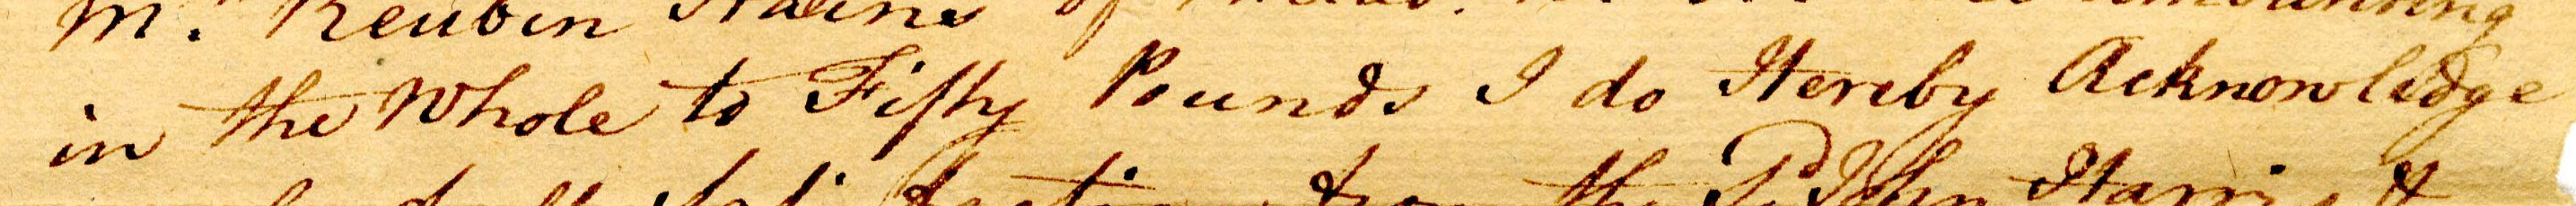in the whole to Fifty Pounds I do hereby Acknowledge
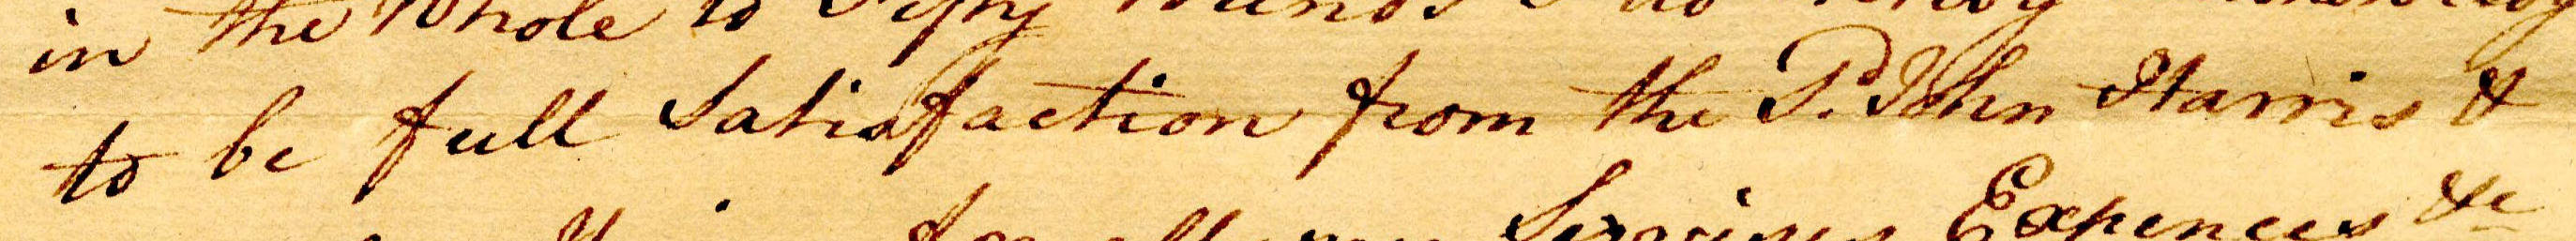to be full satisfaction from the s^d. John Harris &
